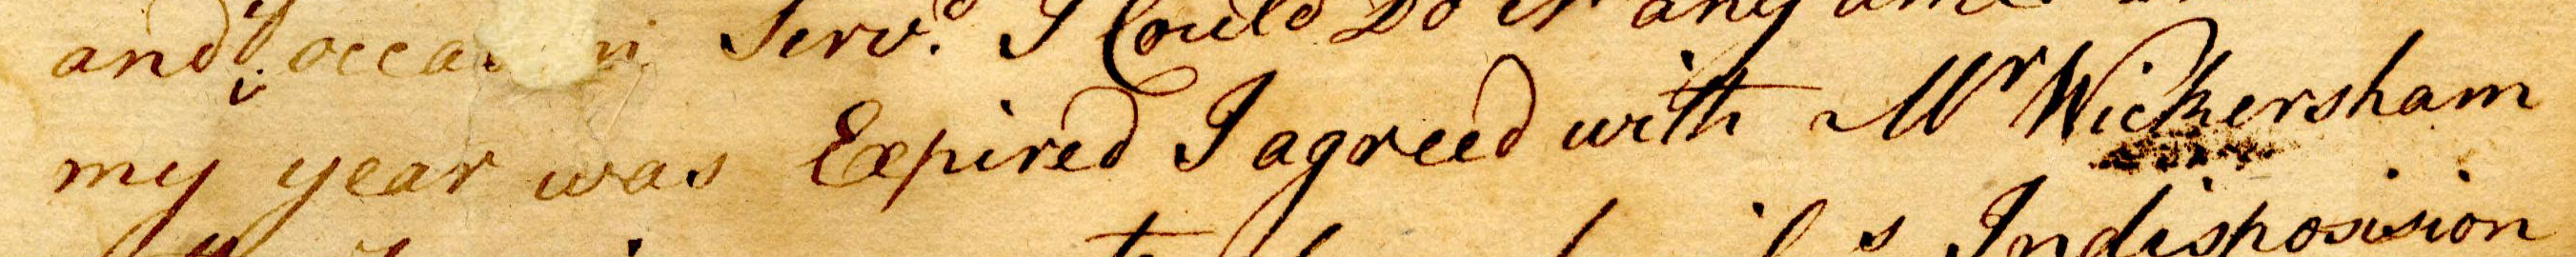my year was Expired I agreed with M^r Wickersham
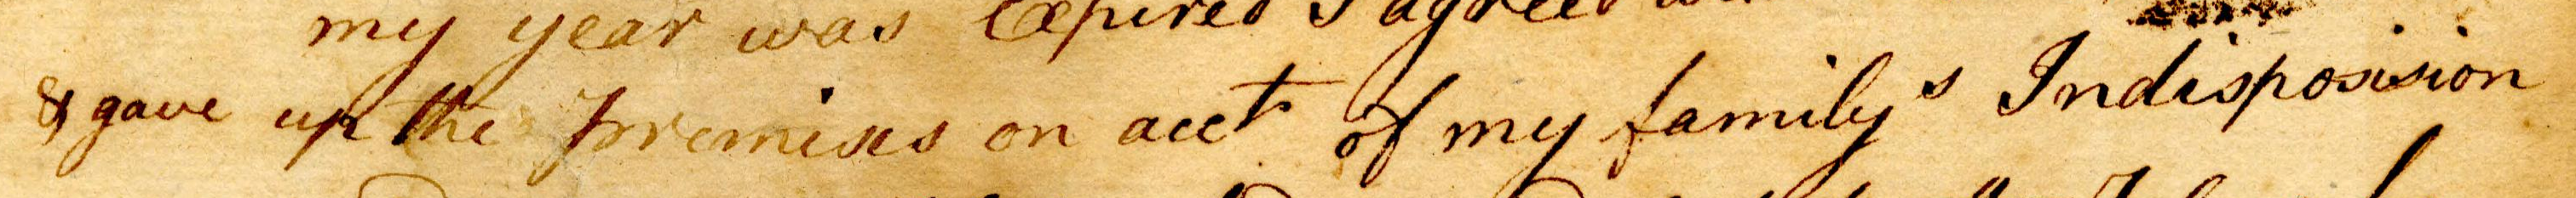& gave up the premises on acc^t of my family^s Indisposision
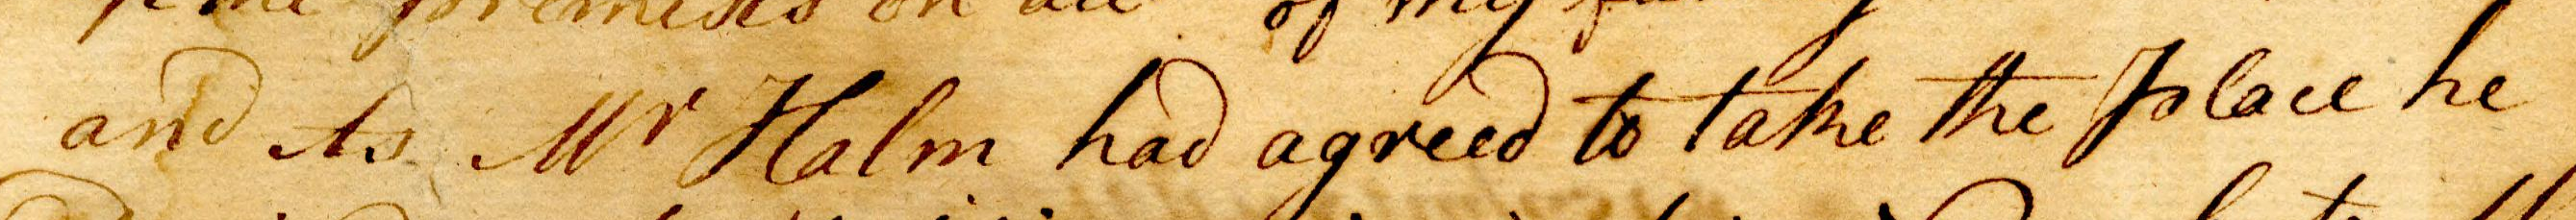and As M^r Halm had agreed to take the place he
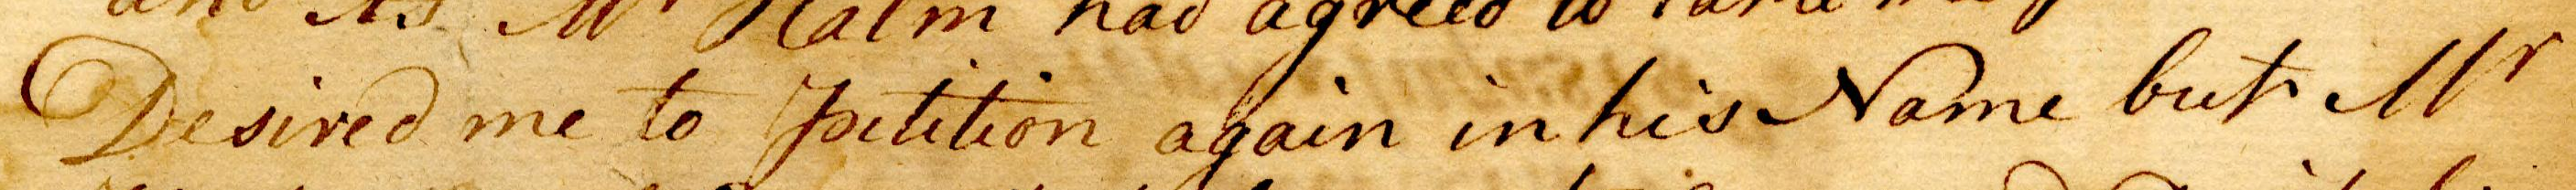Desired me to pitition again in his Name but M^r
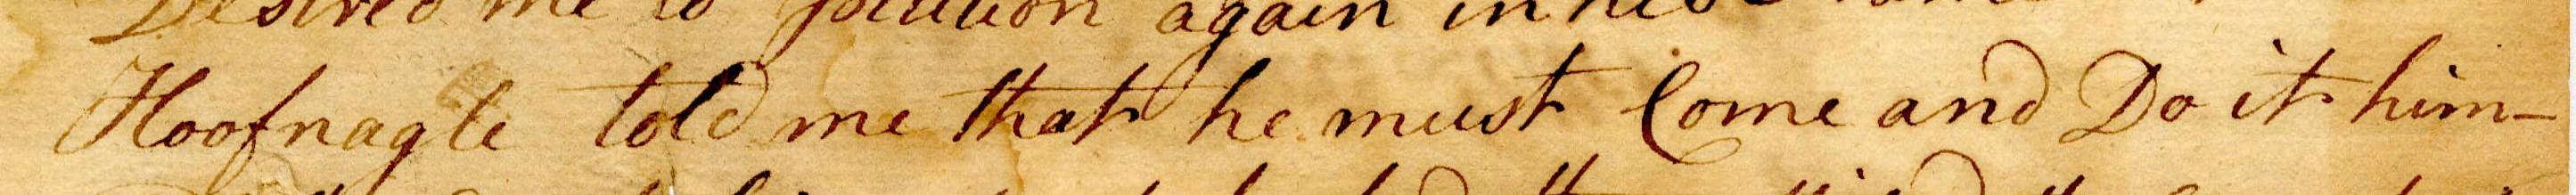Hoofnagle told me that he must Come and Do it him-
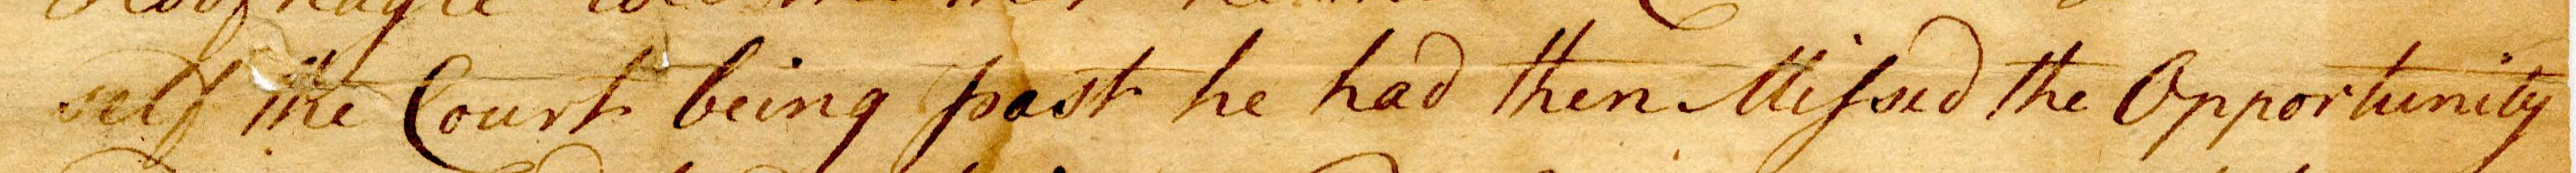self the Court being past he had then Missed the Opportunity
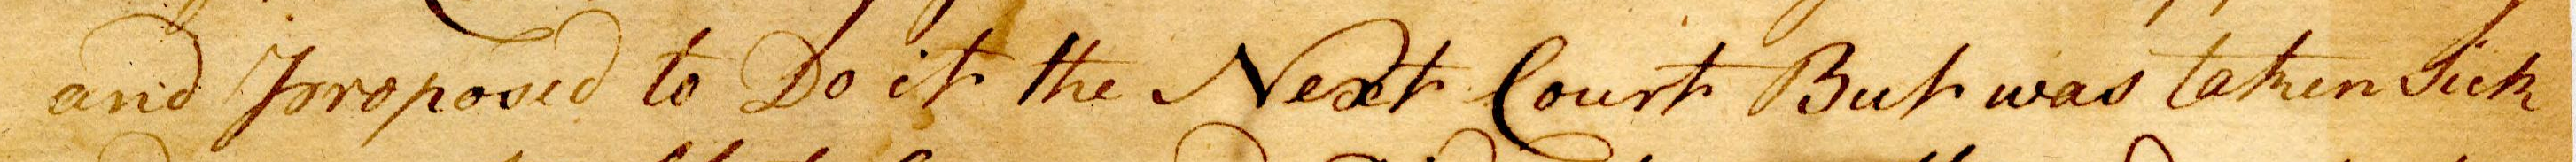and proposed to Do it the Next Court But was taken sick
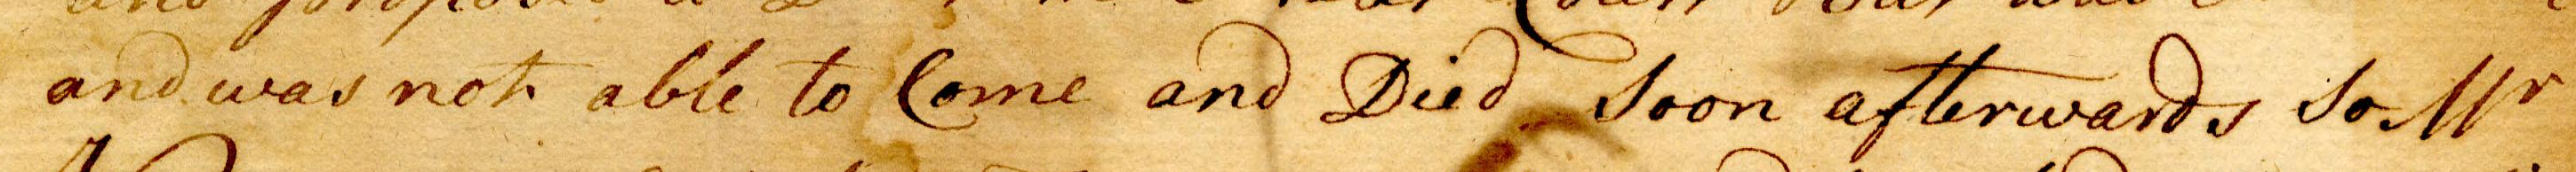and was not able to Come and Died soon afterwards So M^r
